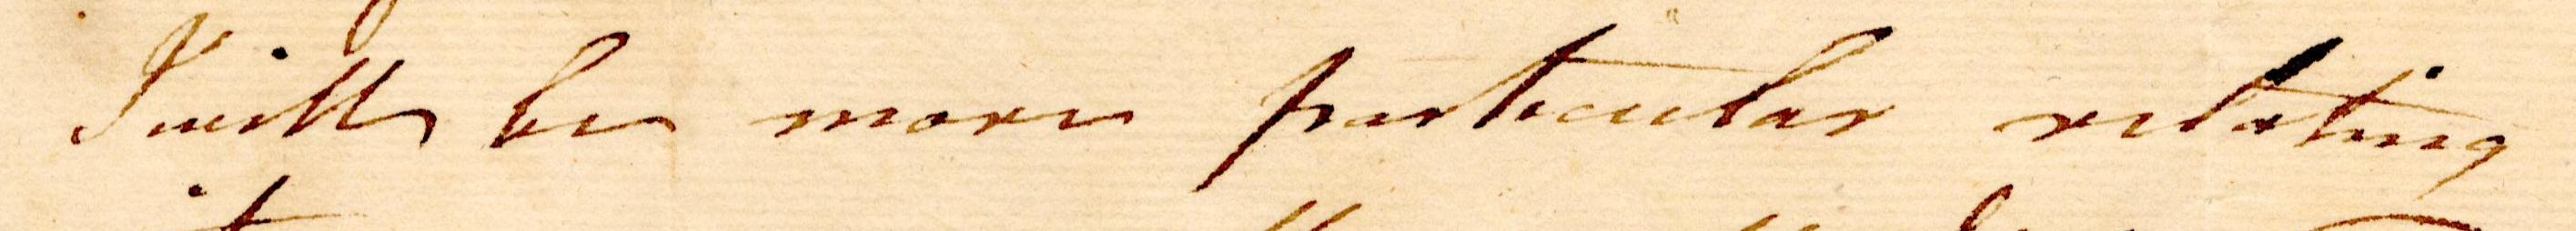I will be more particular relating
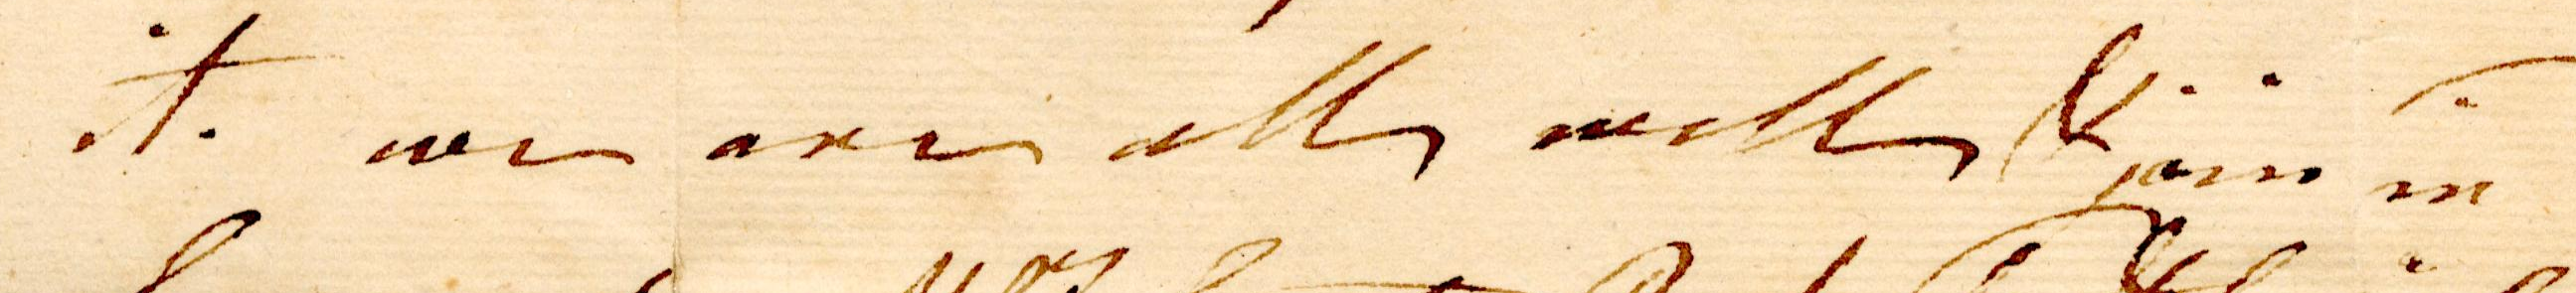it. we are all well & join in
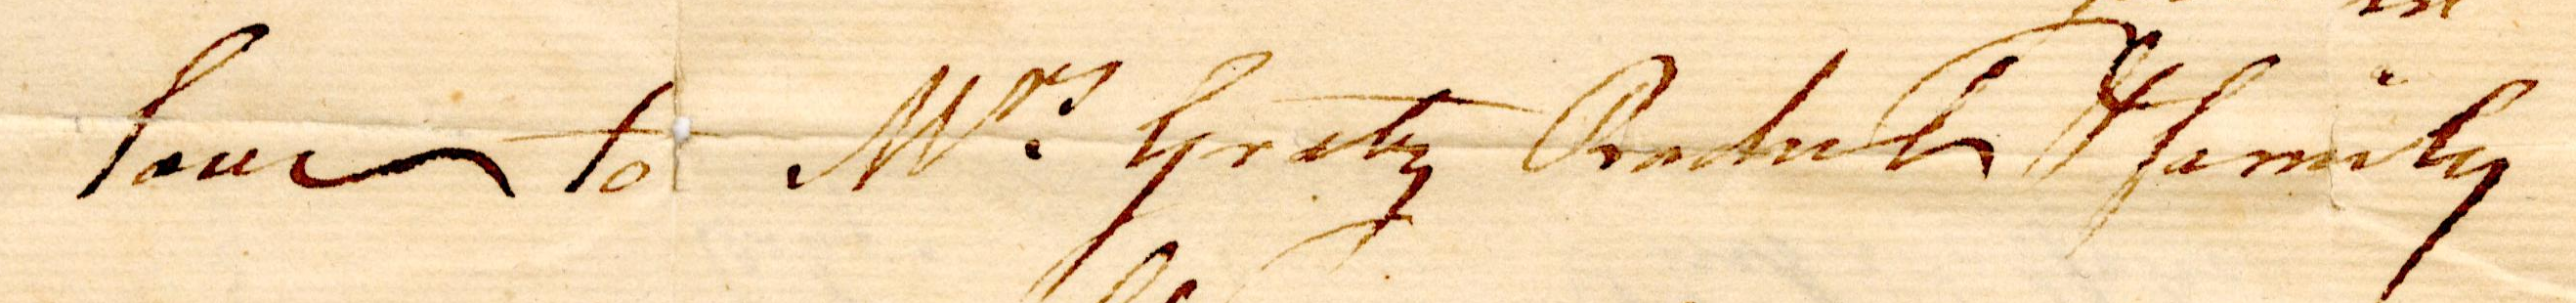love to M^rs. Gratz Rachel & family
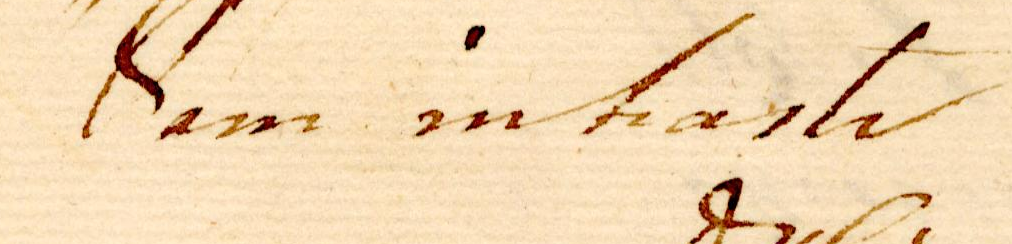& am in haste
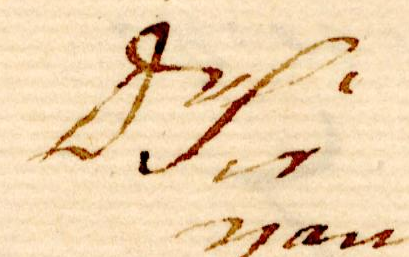D^r Sir
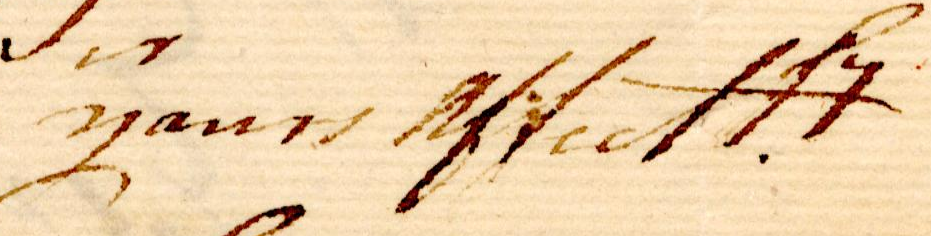your Affect^t
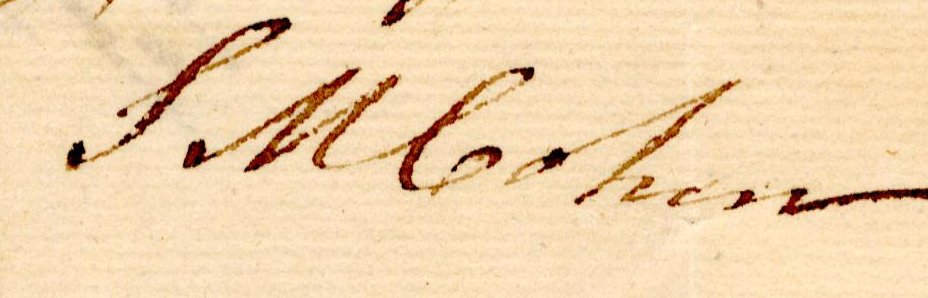S M Cohen
